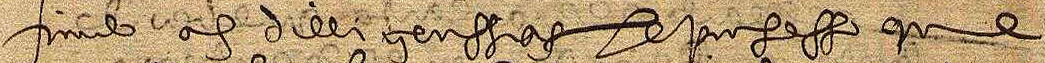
fimdo as dilligenssias he prosesso que
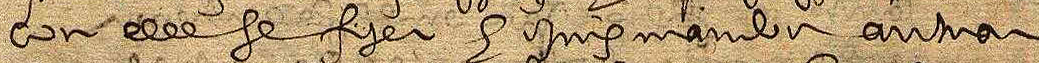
con elle se fizer E o juiz mandou autuar
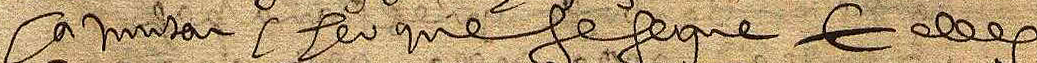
E ajuntar E he o que se segue E elles
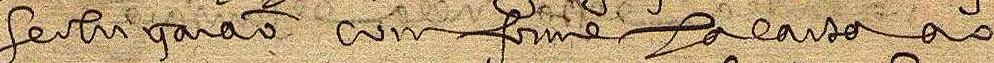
se obrigaraõ comforme ha carta a o
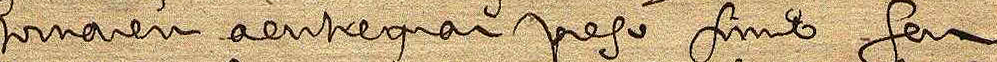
tornaren a entreguar preso findo seu
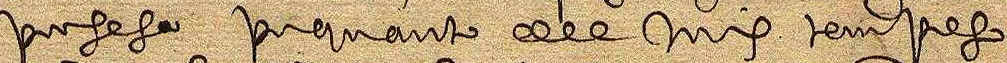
proseso porquanto elle Iuis tem preso
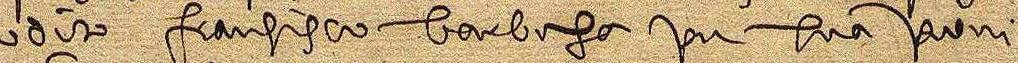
o dito fransisco barbosa por huā proui
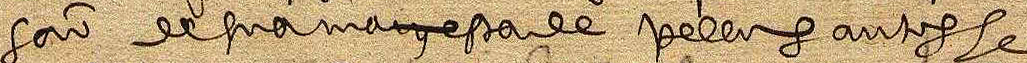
saõ de sua maigestade pellos autos he
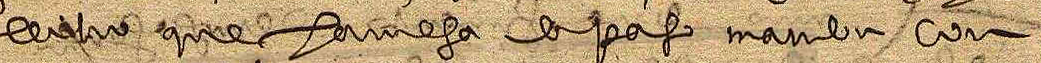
llivro que ha mesa do paso mandou con
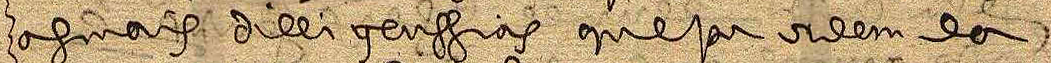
as mais dilligenssias que por ordem da
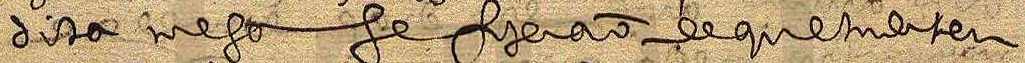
dita mesa se fizeraõ de que tudo ten
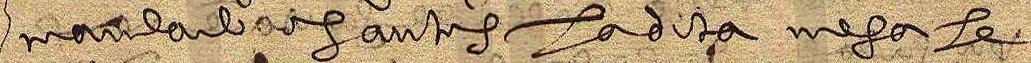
mandado os autos ha dita mesa he
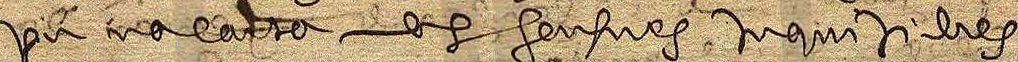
por na carta dos senhores Inquizidores
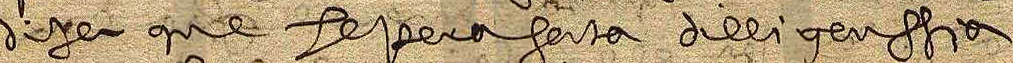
dizer que he pera serta dilligenssia
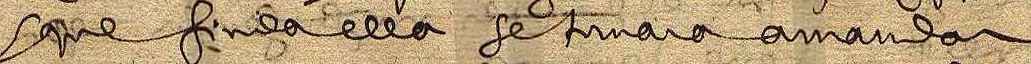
E que finda ella se tornara a mandar
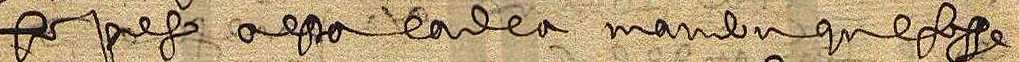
ho preso a esta cadea mandou que fosse
